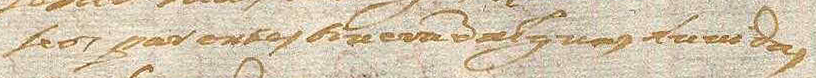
seos parentes tiueraõ alguas duuidas
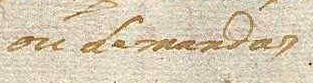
ou demandas
